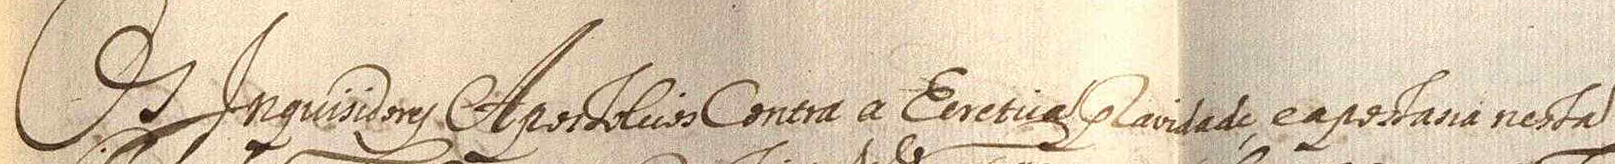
Os Jnquisidores Apostolicos Contra a heretica pRavidade, e apostasia nesta
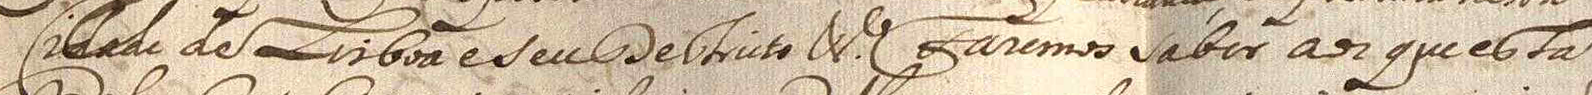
Cidade de Lisboa, e seu Destricto &.a fazemos saber aos que esta
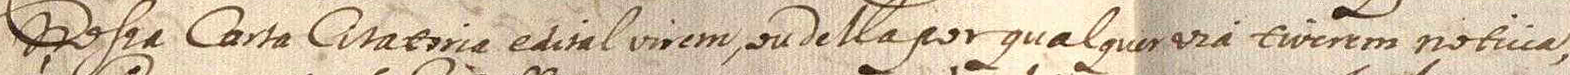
Nossa Carta Citatoria edital virem, ou della por qualquer via tiverem noticia,
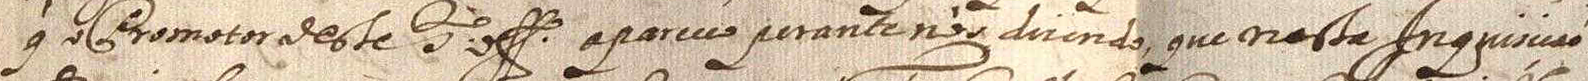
q̄ o Promotor deste s.to off.o apareceo perante nós dizendo, que nesta Jnquisiçaõ
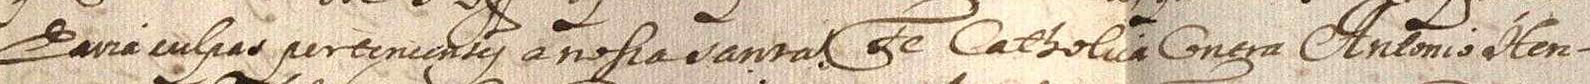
havia culpas pertencentes a nossa santa Fe Catholica Contra Antonio Hen
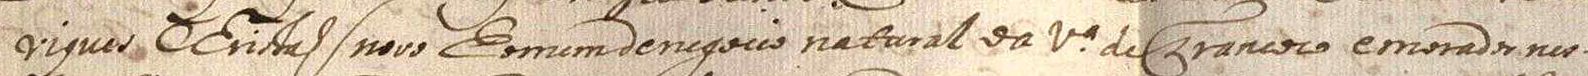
riques Christaõ novo homem de negocio natural da V.a de Trancozo e morador nes
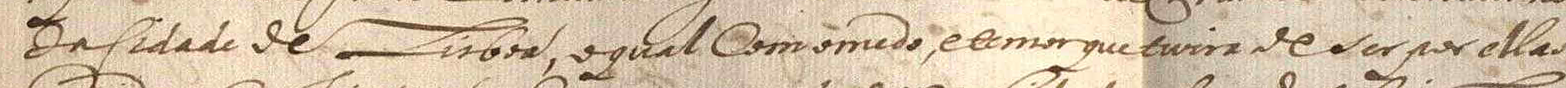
ta Cidade de Lisboa, o qual Com o medo, e temor que tivera de ser por ellas
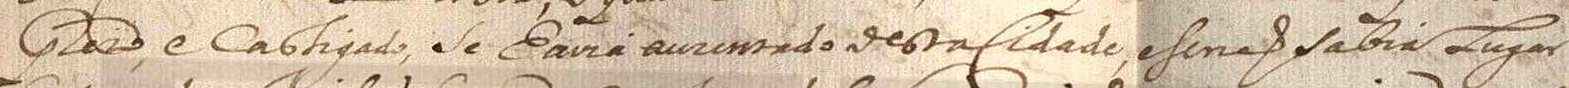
pRezo, e Castigado, se havia auzentado desta Cidade, e se naõ sabia Lugar
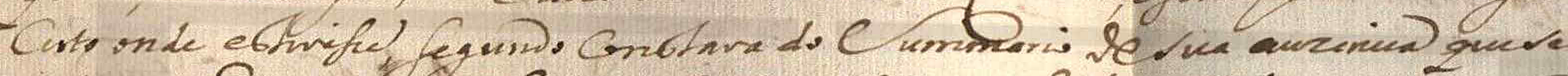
Certo onde estivesse, segundo constava do Summario de sua auzencia que se
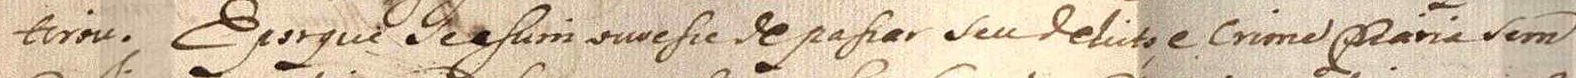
tirou. E porque se assim ouvesse de passar seu delicto, e crime faria sem
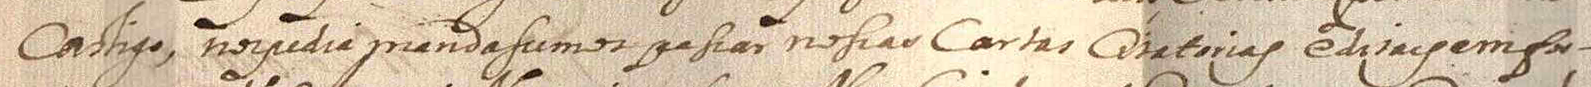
Castigo, nos pedia mandassemos passar nossas Cartas Citatorias editais em for
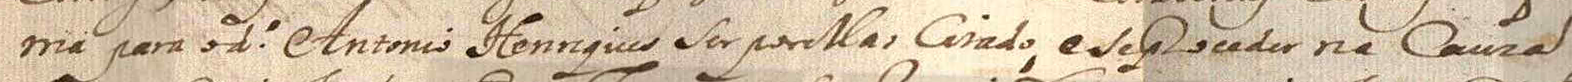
ma para o d.o Antonio Henriques ser por ellas Citado, e se proceder na Cauza
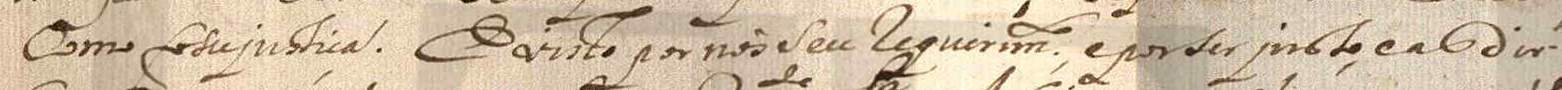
Como fosse justiça. E visto por nós seu Requerim.to e por ser justo, e a dir.o
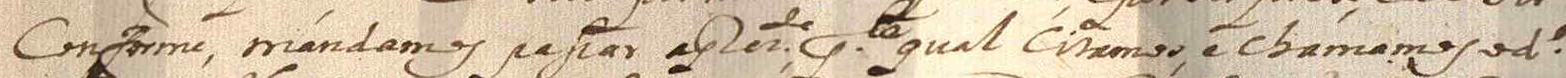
Conforme, mandamos passar a prez.te p.a qual Citamos, e chamamos o d.o
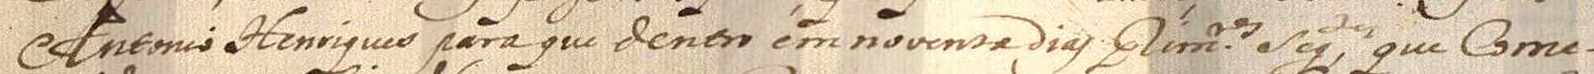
Antonio Henriques para que dentro em noventa dias pRim.ros seg.tes que Come
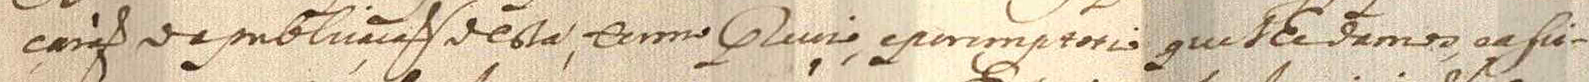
çaraõ da publicaçaõ desta, termo pRecizo, e peremptorio que lhe damos, e assi
